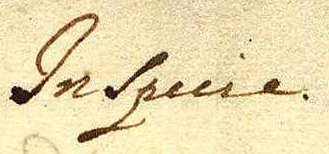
In specie.
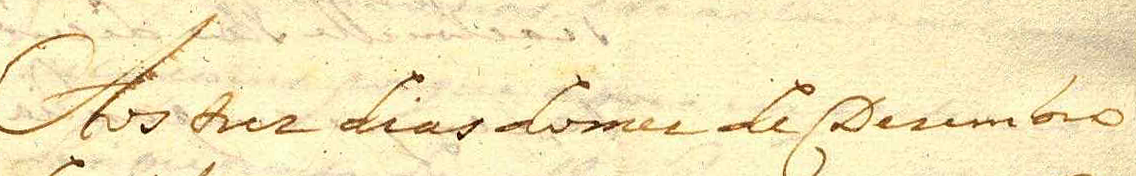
Aos trez dias do mes de Dezembro
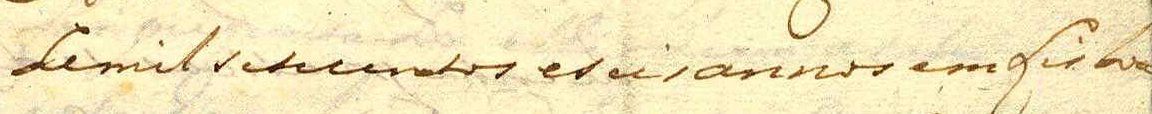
de mil setecentos e seis annos em Lisboa
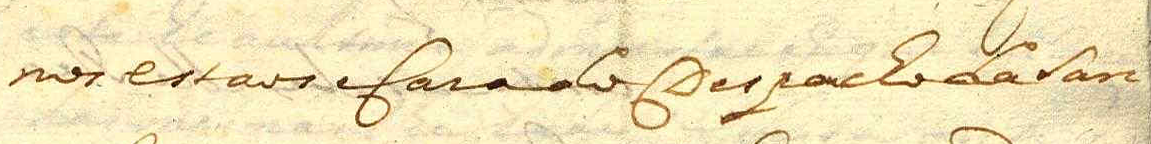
nos estaos e Caza do Despacho da San
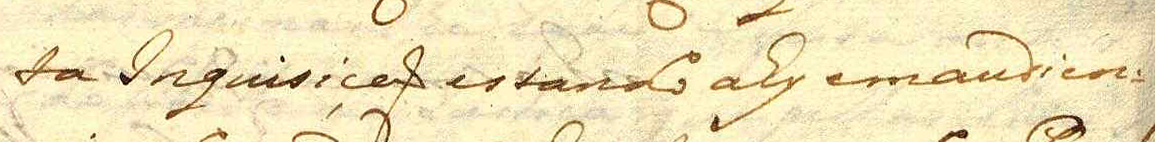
ta Inquisiçaõ estando ahy em audien
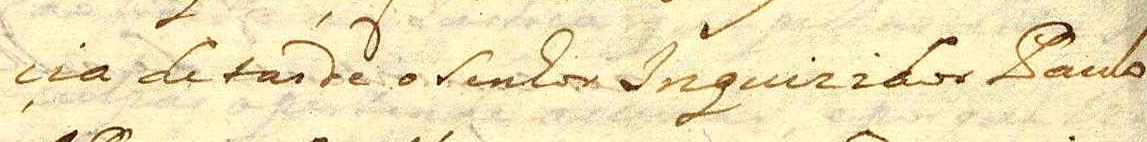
cia de tarde o senhor Inquizidor Paulo
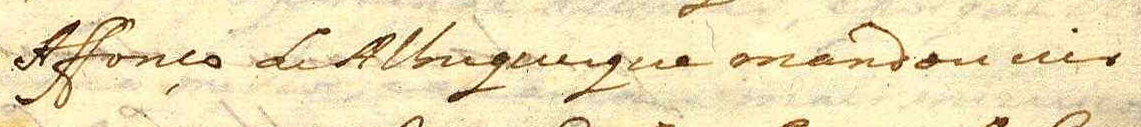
Affonço de Albuquerque mandou uir
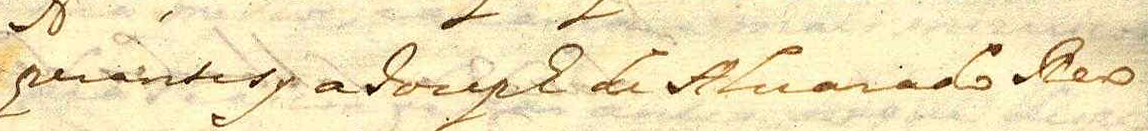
perante sy a Iozeph de Aluarado Reo
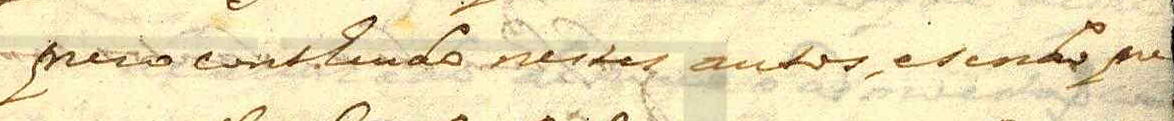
prezo contheudo nestes autos, e sendo pre
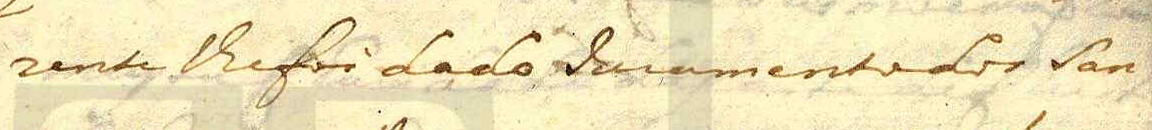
zente lhe foi dado Iuramento dos San
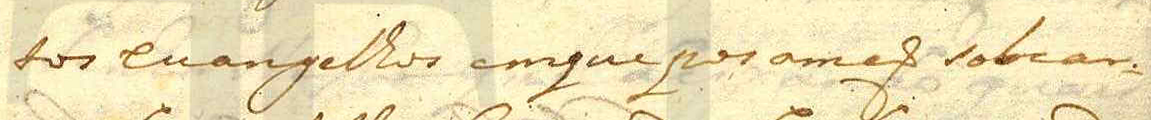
tos euangelhos em que pos a maõ sob car
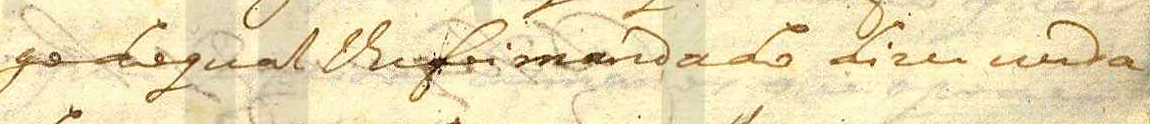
go do qual lhe foi mandado dizer uerda
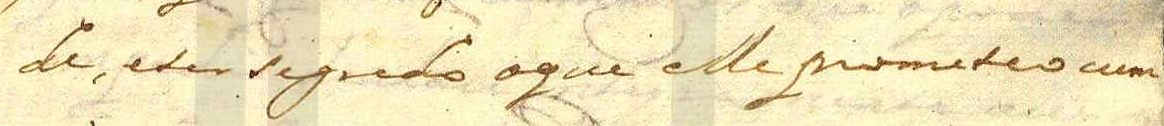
de, e ter segredo o que elle prometeo cum
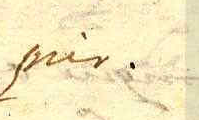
prir.
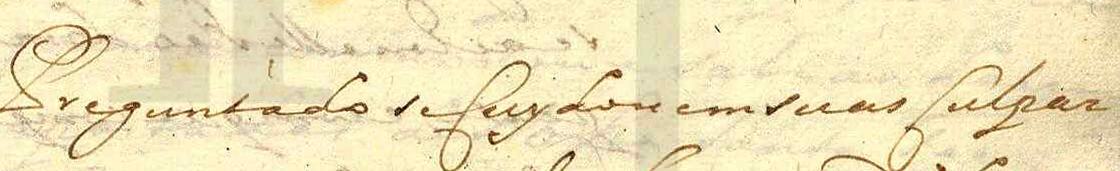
Preguntado se Cuydou em suas Culpas
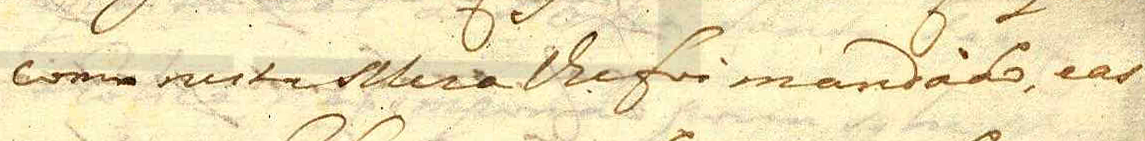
como nesta Meza lhe foi mandado, e as
